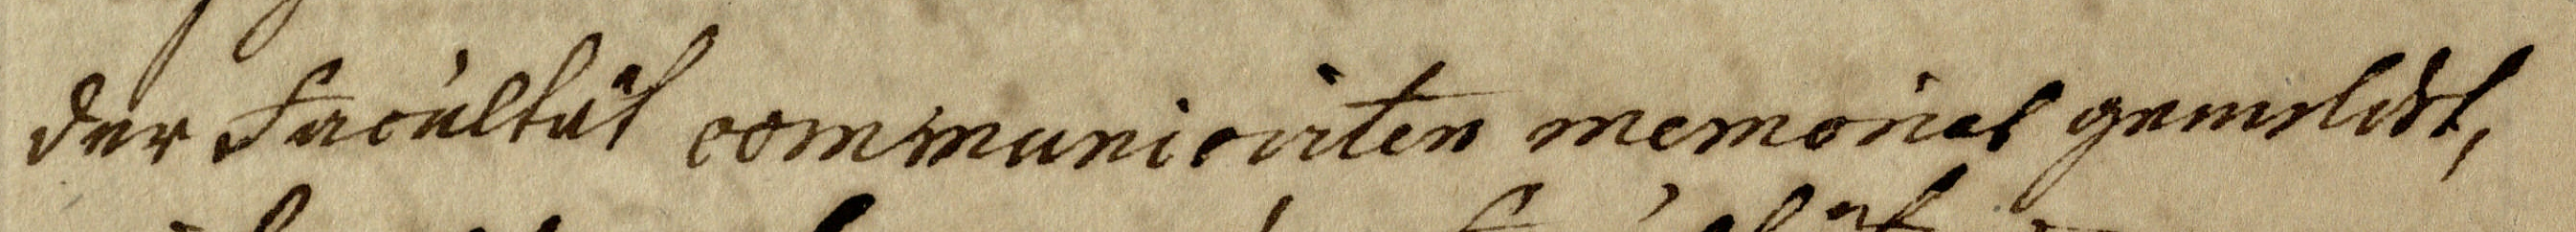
der Facultät communicirten memorial gemeldet,
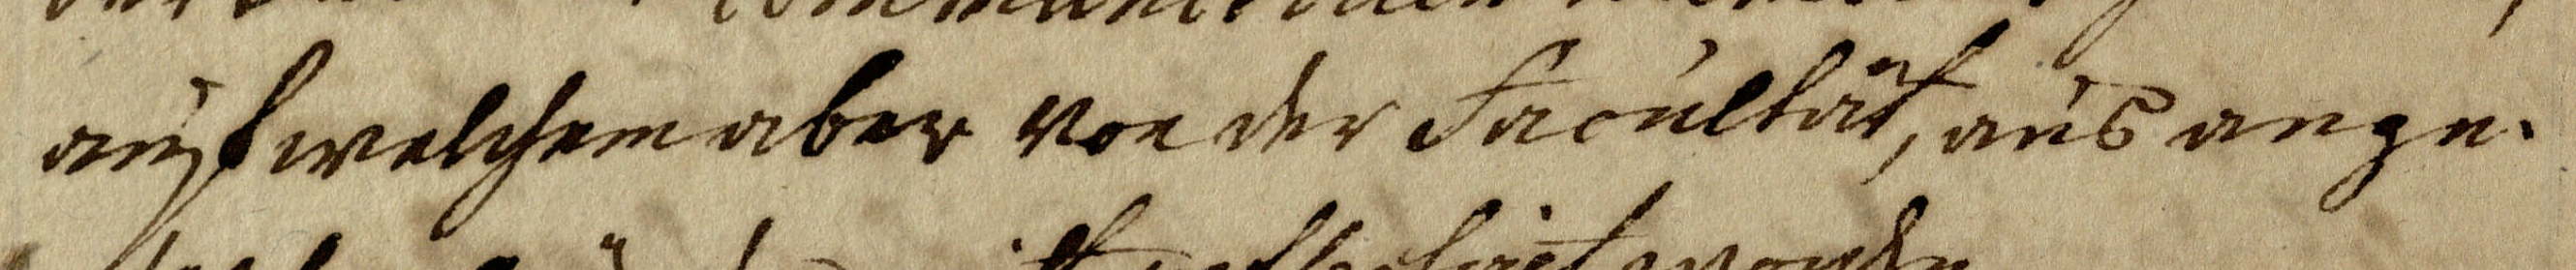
auf welchem aber von der Facultät aus ange¬
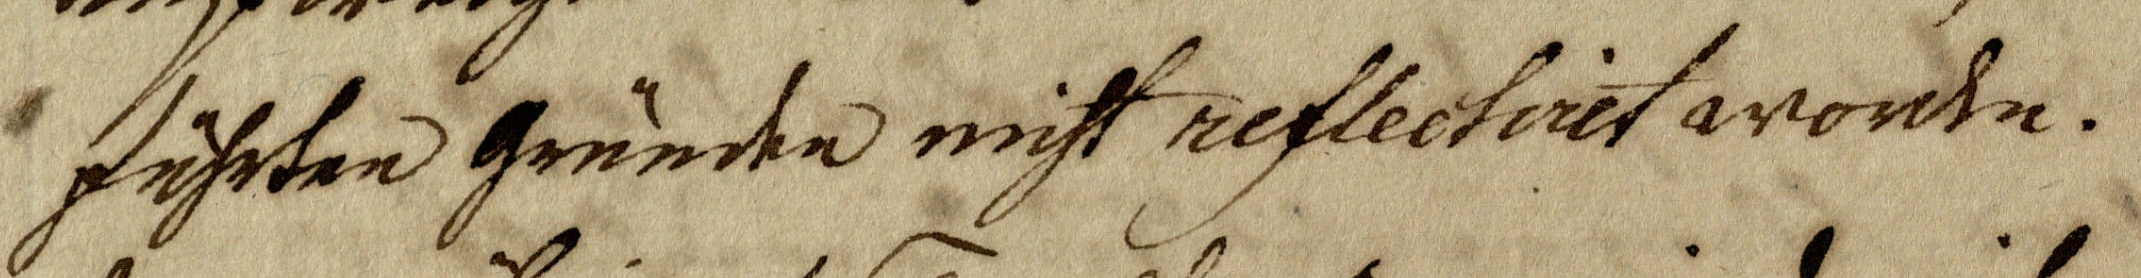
führten Gründen nicht reflectiret worden.
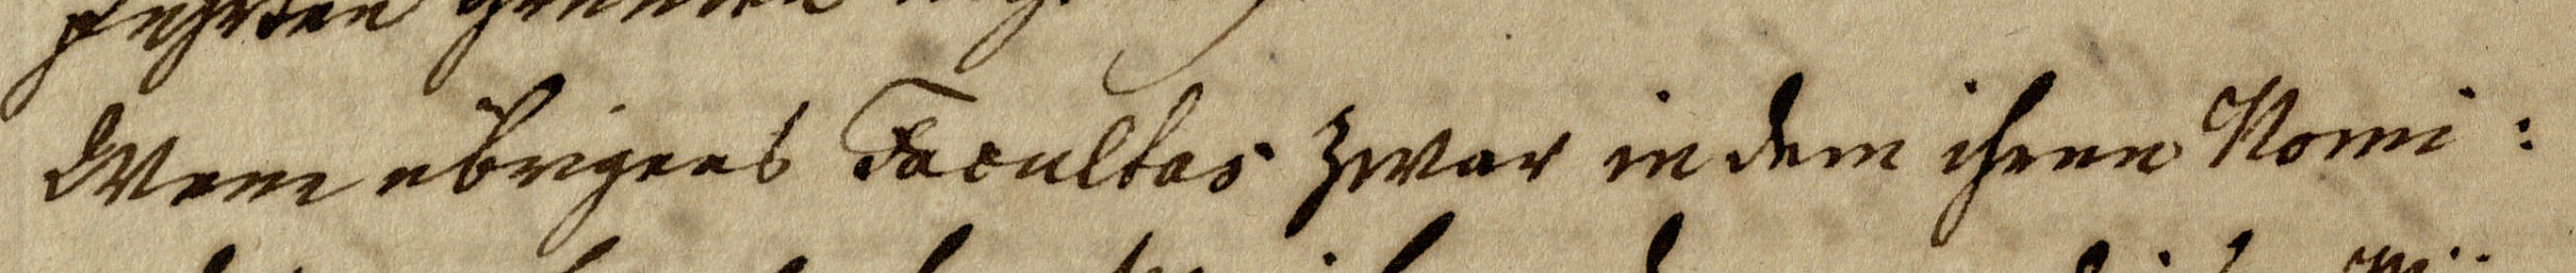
Wenn übrigens Facultas zwar in dem ihren Nomi¬
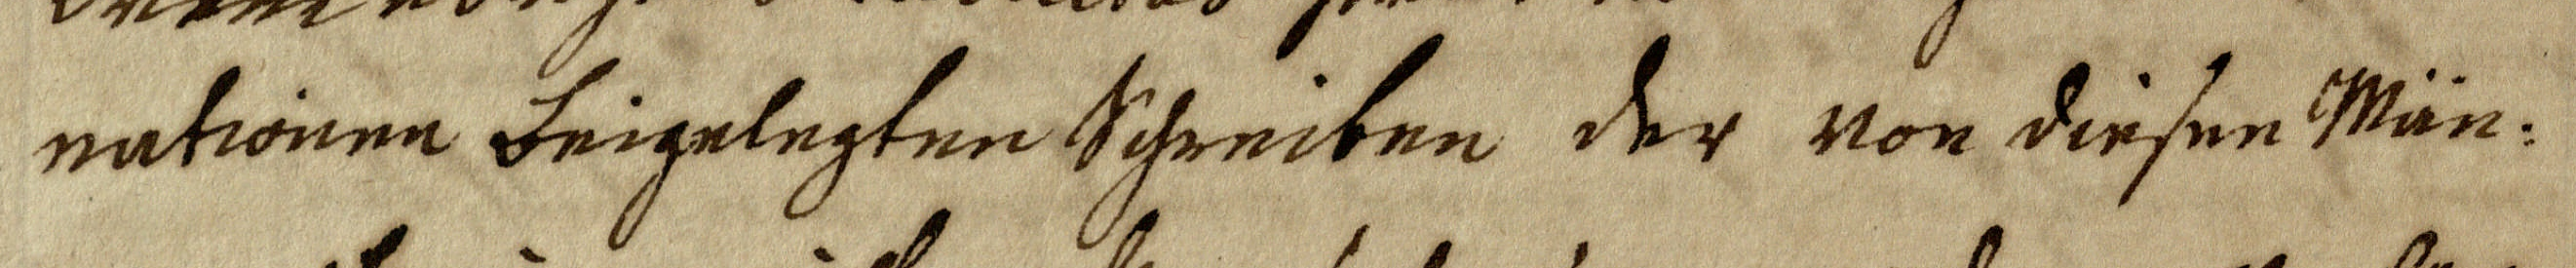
nationen beigelegten Schreiben der von diesen Män¬
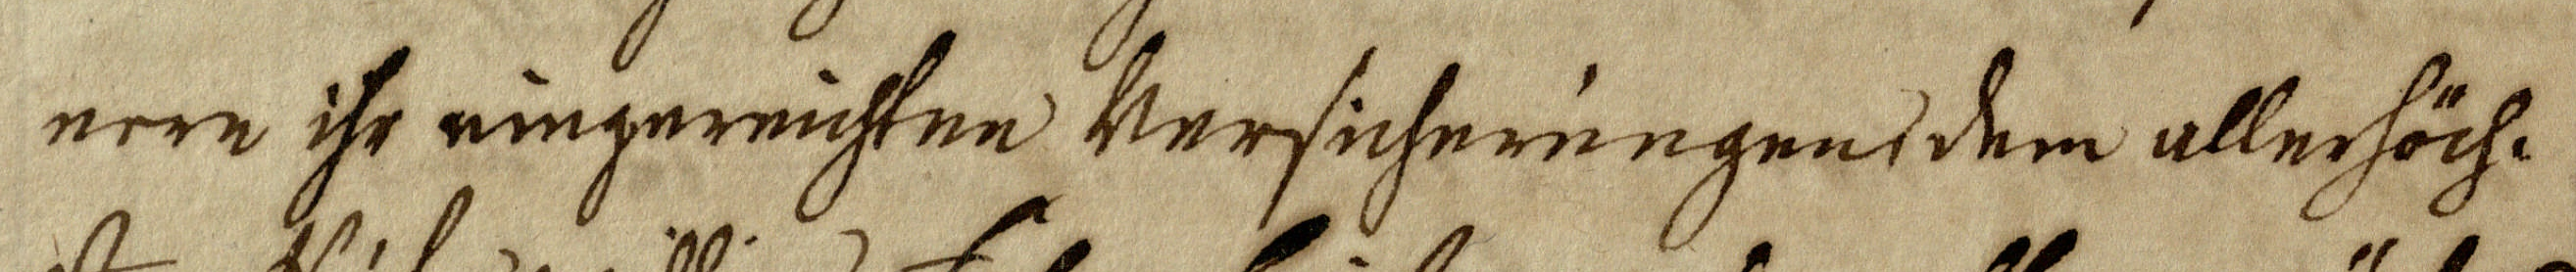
nern ihr eingereichten Versicherungen, dem allerhöch¬
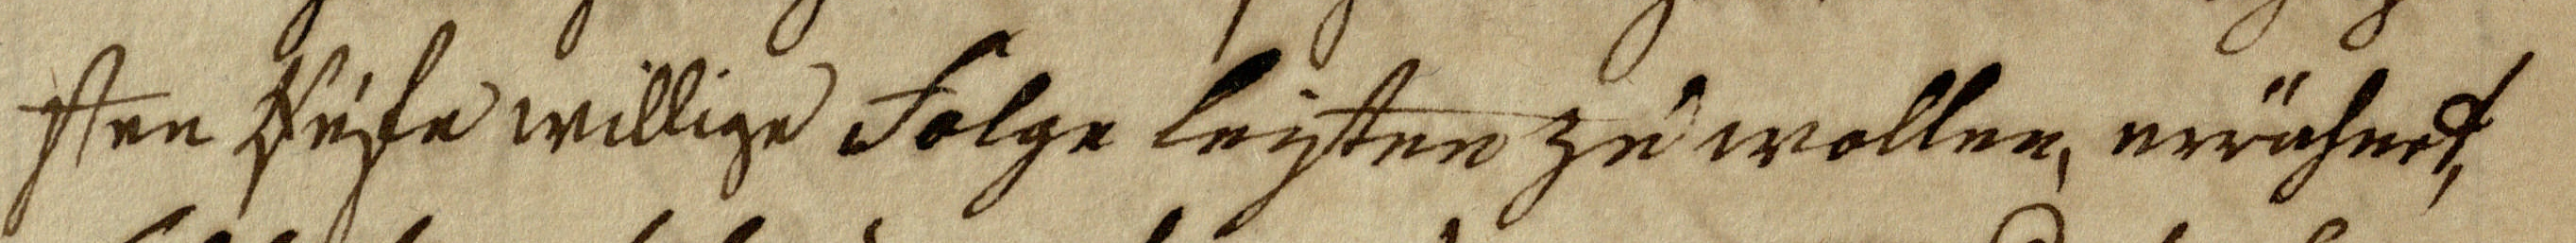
sten Rufe willige Folge leisten zu wollen, erwähnet,
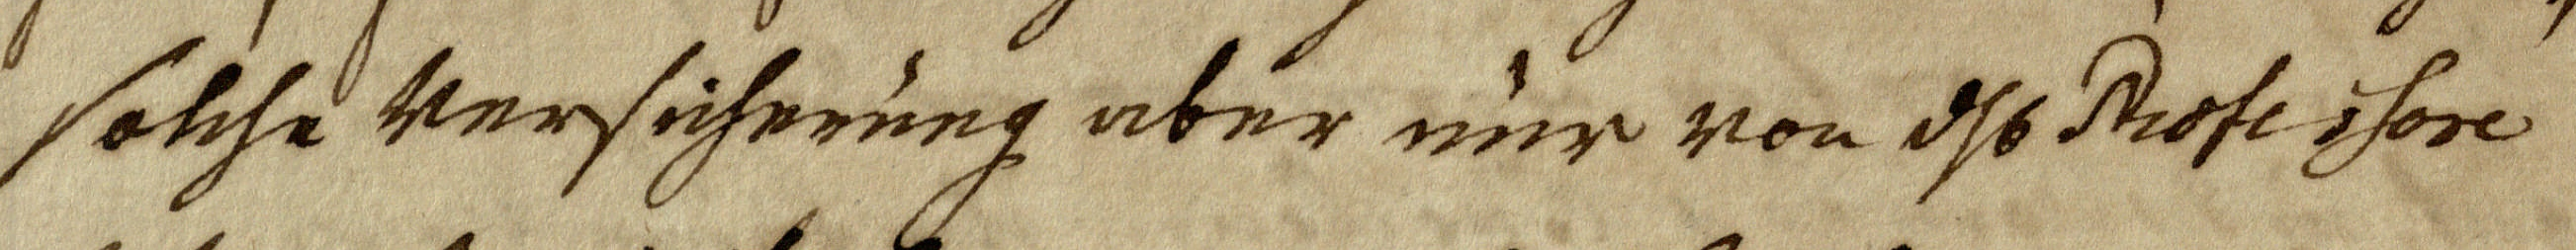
solche Versicherung aber nur von dh. Professore
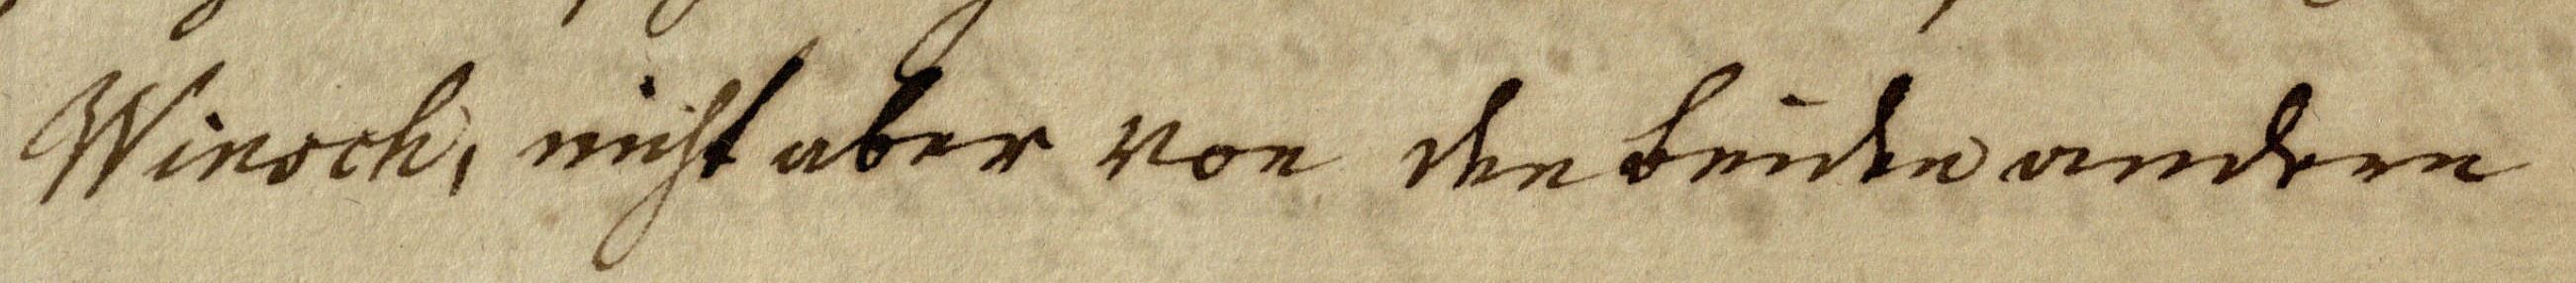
Winsch, nicht aber von den beiden andern
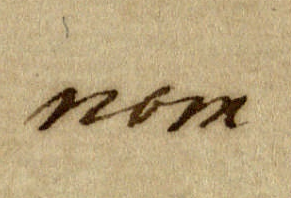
nom
